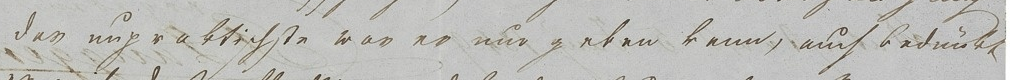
das unpraktischste was es nur geben kann, auch bedünkt
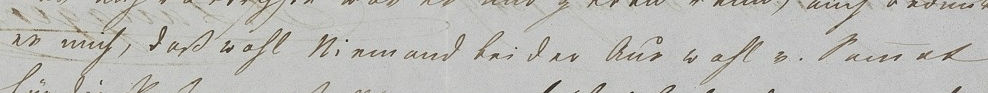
es mich, daß wohl Niemand bei der Auswahl v. Sammet
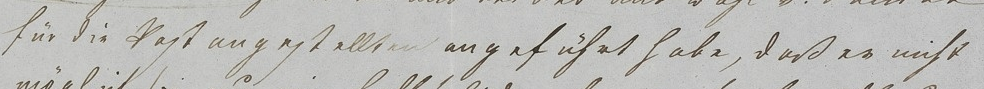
für die Postangestellten angeführt habe, daß es nicht
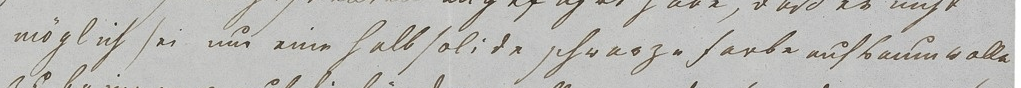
möglich sei nur eine halbsolide schwarze Farbe auf Baumwolle
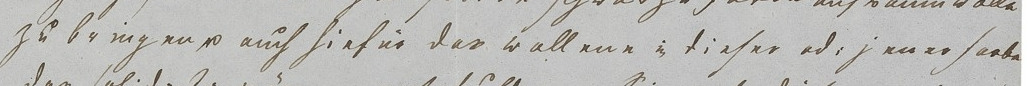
zu bringen & auch hierfür das wollene in dieser od: jener Farbe
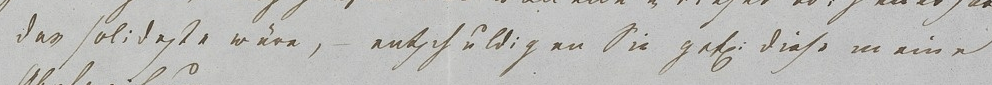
das solideste wäre, – entschuldigen Sie gefl: diese meine
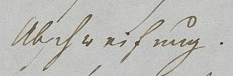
Abschweifung.
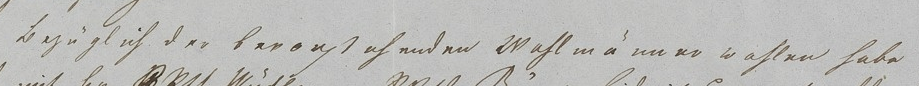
Bezüglich der bevorstehenden Wahlmännerwahlen habe
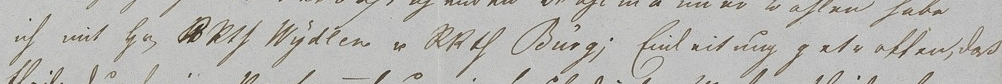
ich mit Hrn BRth Wydler & RRth Bürgi Einleitung getroffen, daß
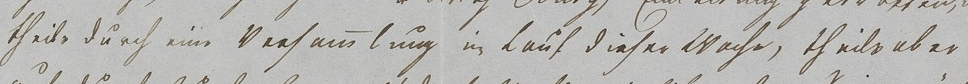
theils durch eine Versammlung im Lauf dieser Woche, theils aber
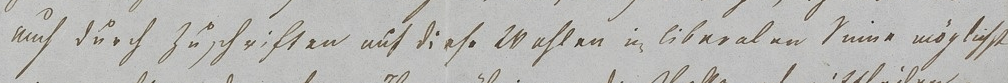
auch durch Zuschriften auf diese Wahlen im liberalen Sinne möglichst
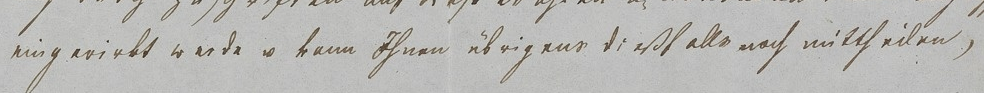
eingewirkt werde & kann Ihnen übrigens dießfalls noch mittheilen,
